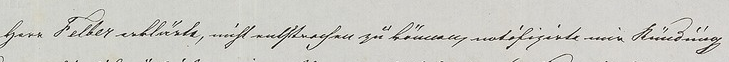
Herr Felber erklärte, nicht entsprechen zu können, notifizirte eine Kündung
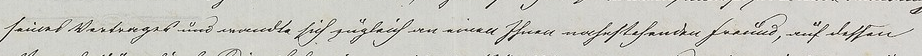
seines Vertrages und wandte sich zugleich an einen Ihnen nahestehenden Freund, auf dessen
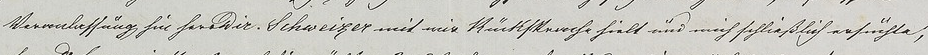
Veranlassung hin Herr Dir. Schweizer mit mir Rücksprache hielt und mich schließlich ersuchte,
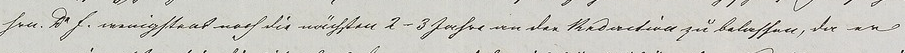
Hrn. DrF. wenigstens noch die nächsten 2–3 Jahre an der Redaction zu belassen, da er
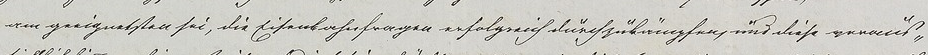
am geeignetsten sei, die Eisenbahnfragen erfolgreich durchzukämpfen, und diese voraus-
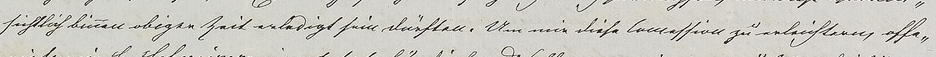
sichtlich binnen obiger Zeit erledigt sein dürften. Um mir diese Concession zu erleichtern, offe-
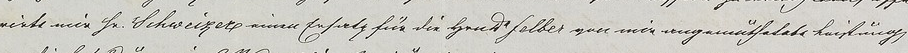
rirte mir Hr. Schweizer einen Ersatz für die Hrn DrFelber von mir angemuthetete Leistung
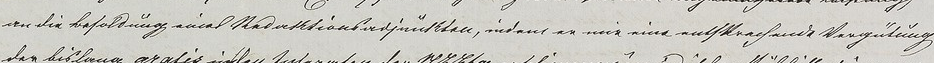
an die Besoldung eines Redaktionsadjunkten, indem er mir eine entsprechende Vergütung
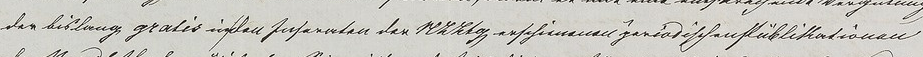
der bislang gratis in den Inseraten der NZZtg erschienenen periodischen Publikationen
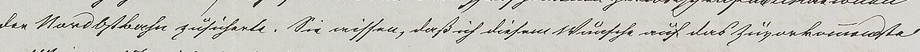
der Nordostbahn zusicherte. Sie wissen, daß ich diesem Wunsche auf das Zuvorkommenste
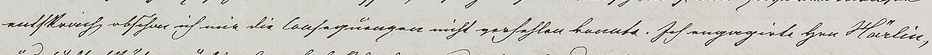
entsprach, obschon ich mir die Consequenzen nicht verhehlen konnte. Ich engagirte Hrn Härlin,
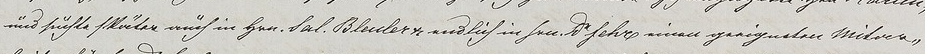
und suchte später auch in Hrn. Sal. Bleuler & endlich in Hrn. DrFehr einen geeigneten Mitar-
